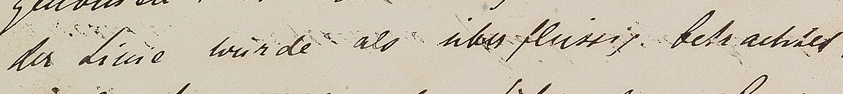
der Linie wurde als überflüssig betrachtet.
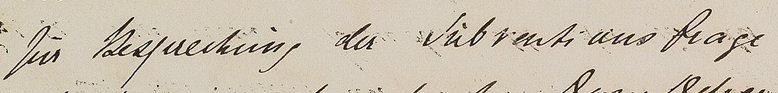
Zur Besprechung der Subventionsfrage
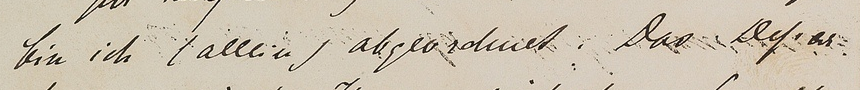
bin ich (allein) abgeordnet. Das Depar-
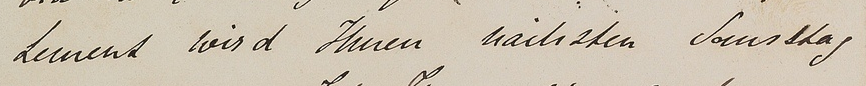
tement wird Ihnen nächsten Samstag
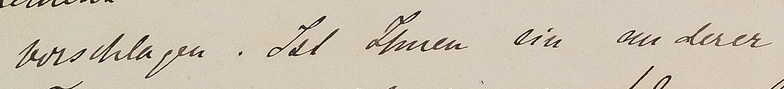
vorschlagen. Ist Ihnen ein anderer
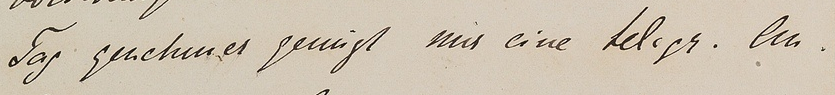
Tag genehmer genügt nur eine telegr. An-
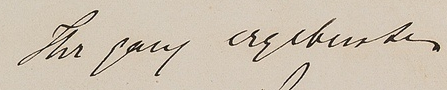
Ihr ganz ergebenster
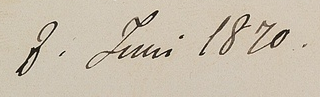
8. Juni 1870.
